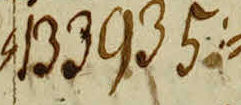133935
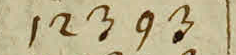12393
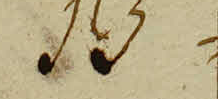13
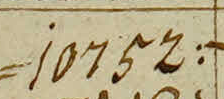10752
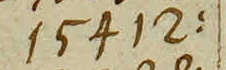15412
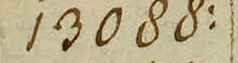13088
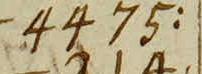4475
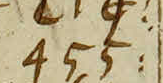455
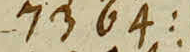7364
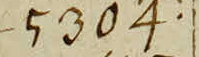5304
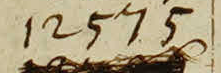12575
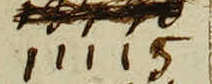11115
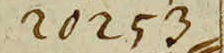20253
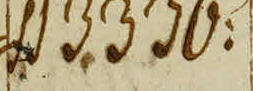113336
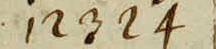12324
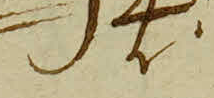14
